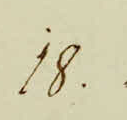18.
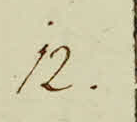12.
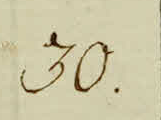30.
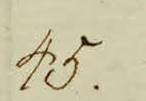45.
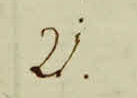21.
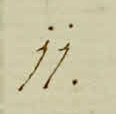11.
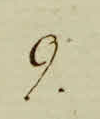9.
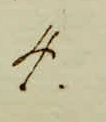4.
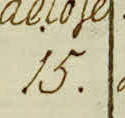15.
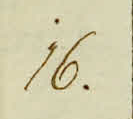16.
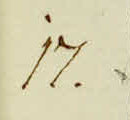17.
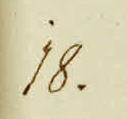18.
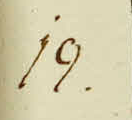19.
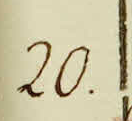20.
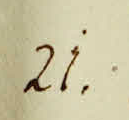21.
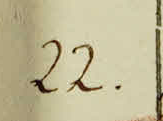22.
